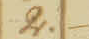2.
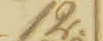12.
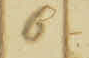6
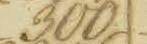300
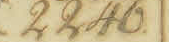2246.
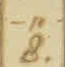8.
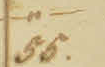55.
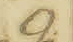9.
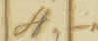4.
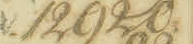12920.
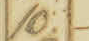10.
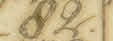82.
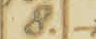8.
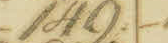149.
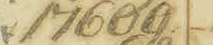17609.
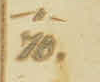70.
